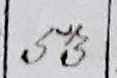53
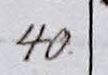40.
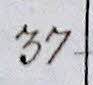37
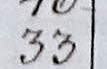33
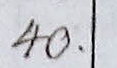40.
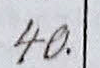40.
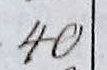40
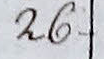26
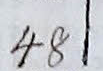48
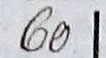60
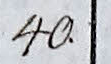40.
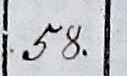58.
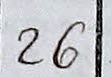26
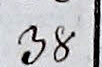38
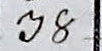38
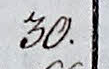30.
